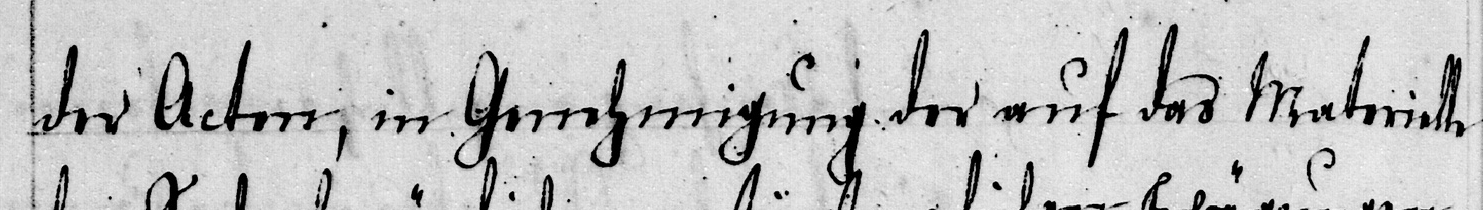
der Acten, in Genehmigung der auf das Materiel¬
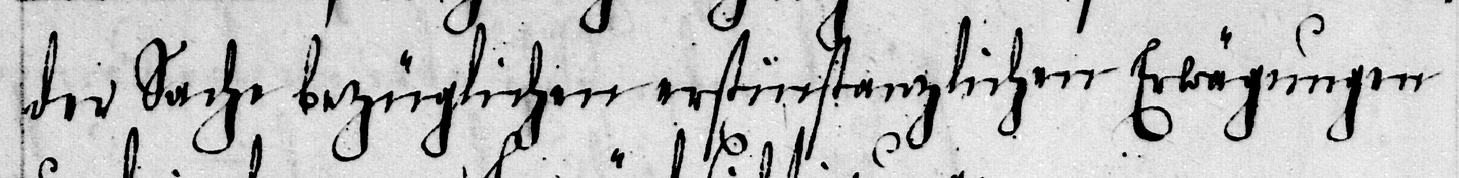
der Sache bezüglichen erstinstanzlichen Erwägungen
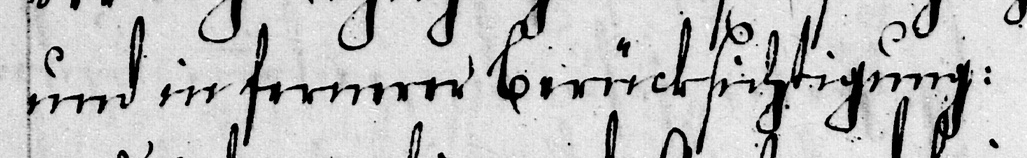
und in fernerer Berücksichtigung:
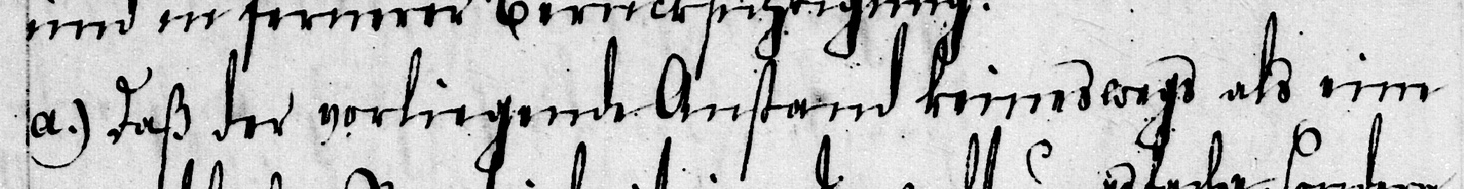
a.) Daß der vorliegende Anstand keineswegs als eine
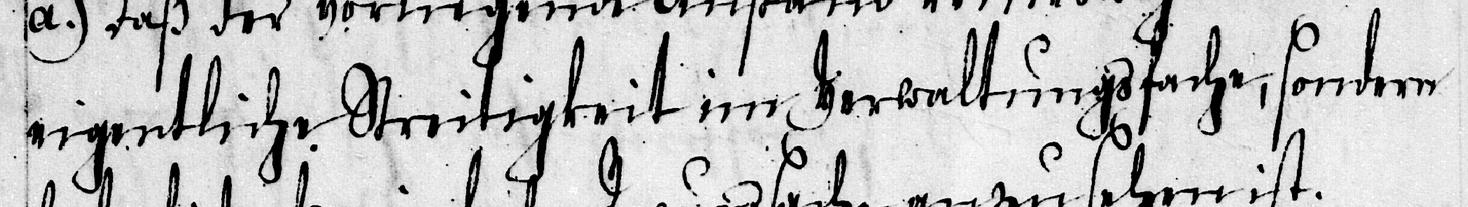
eigentliche Streitigkeit im Verwaltungsfache, sondern
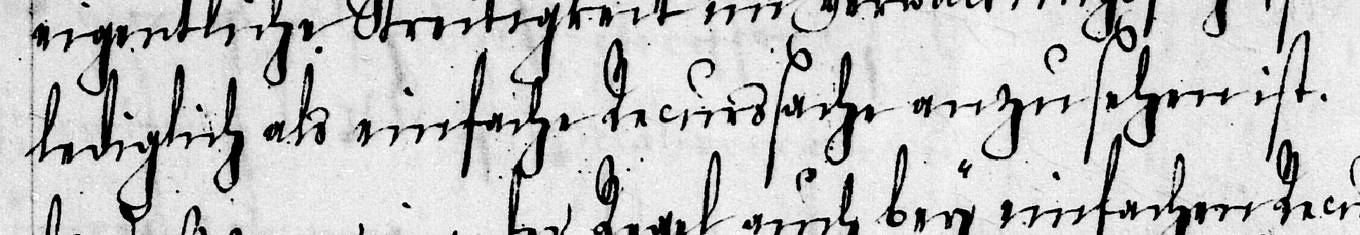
lediglich als einfache Recurssache anzusehen ist.
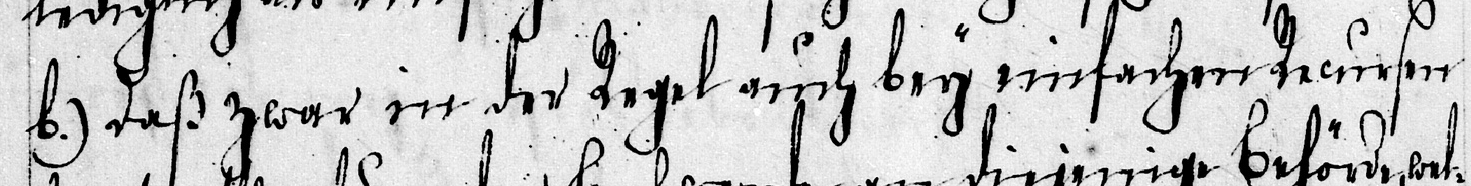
b.) Daß zwar in der Regel auch bey einfachen Recursen
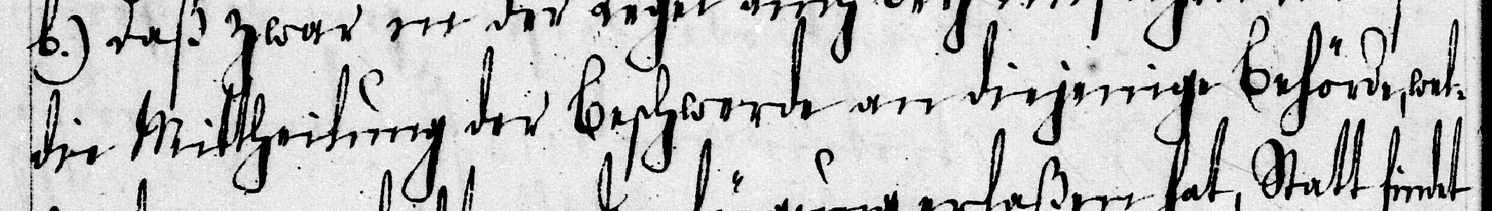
die Mittheilung der Beschwerde an diejenige Behörde, we¬
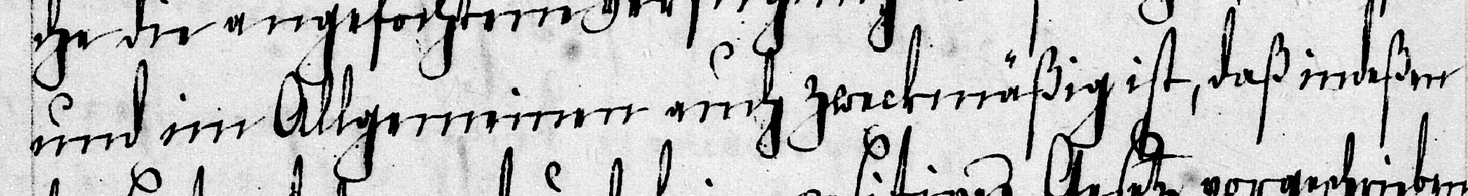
und im Allgemeinen auch zweckmäßig ist, daß indeßen
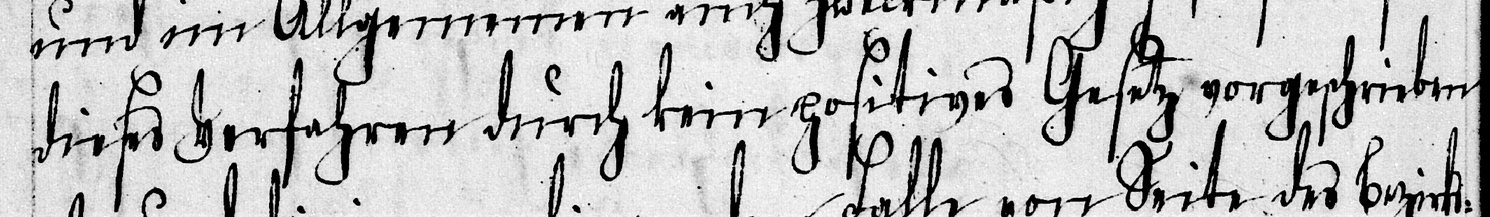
dieses Verfahren durch kein positives Gesetz vorgeschrie¬
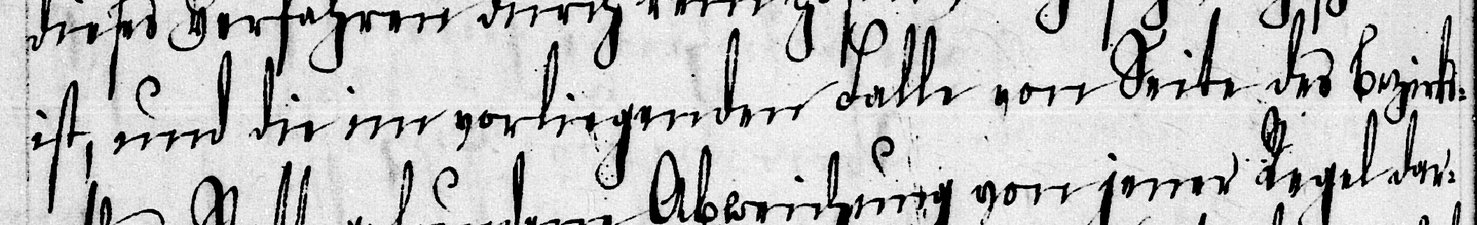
ist, und die im vorliegenden Falle von Seite des Bezir¬
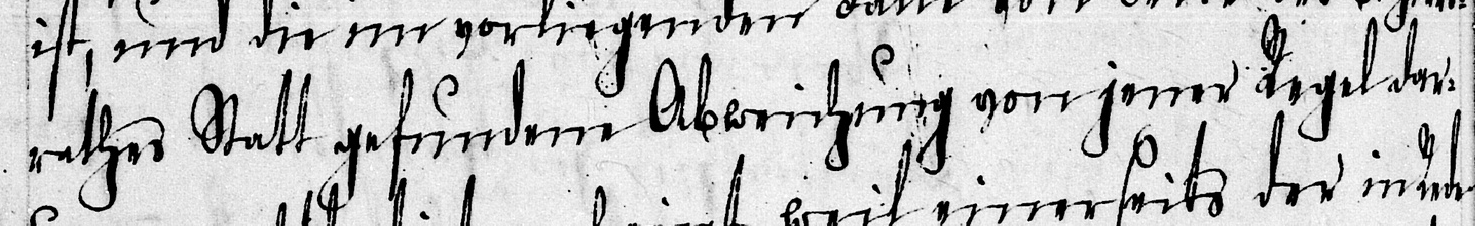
rathes Statt gefundene Abweichung von jener Regel dar¬
